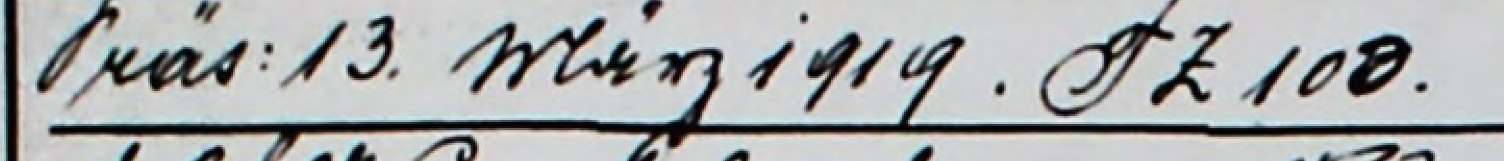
Präs: 13 März 1919. T Z 108.
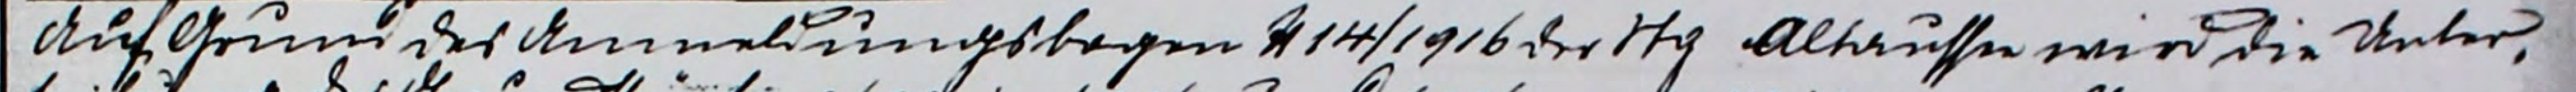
Auf Grund des Anmeldungsbogen N 14/1916 der Stg Altaussee wird die Unter„
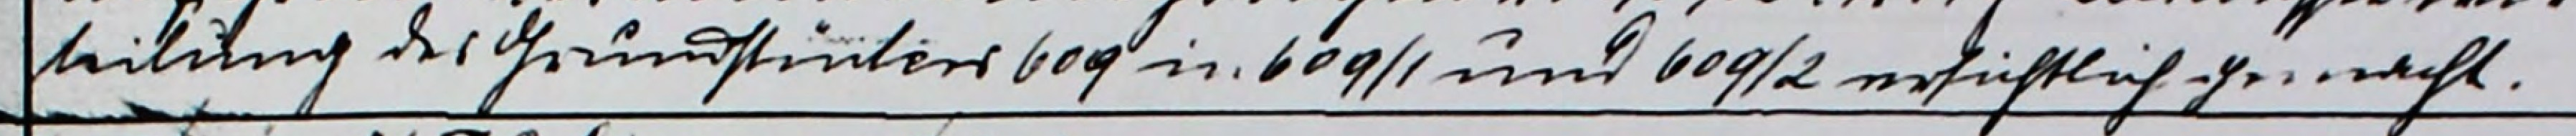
teilung des Grundstückes 609 in 609/1 und 609/2 ersichtlich gemacht.
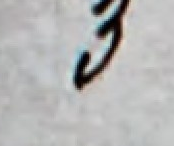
3
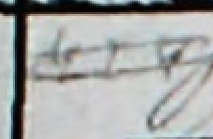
424
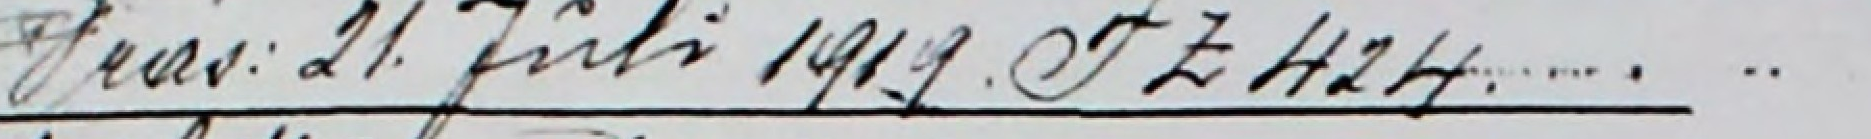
Präs: 21 Juli 1919. T Z 424.
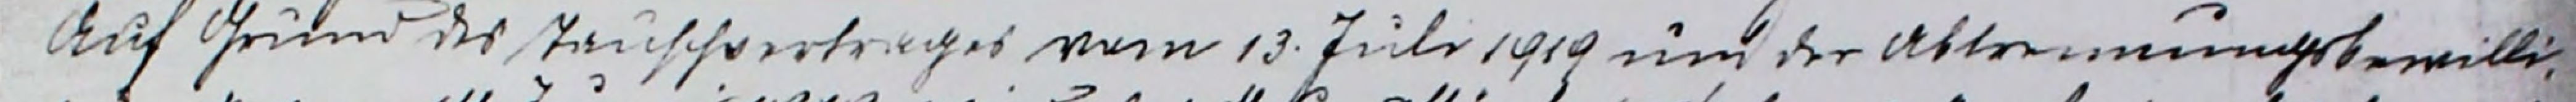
Auf Grund des Tauschvertrages vom 13. Juli 1919 und der Abtrennungsbewilli„
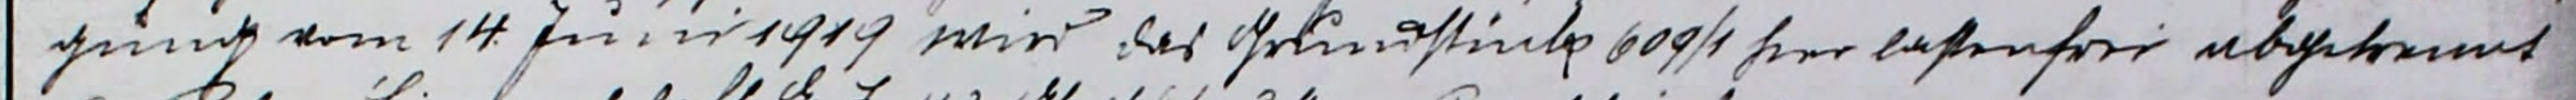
gung vom 14. Juni 1919 wird das Grundstück 609/1 hier lastenfrei abgetrennt
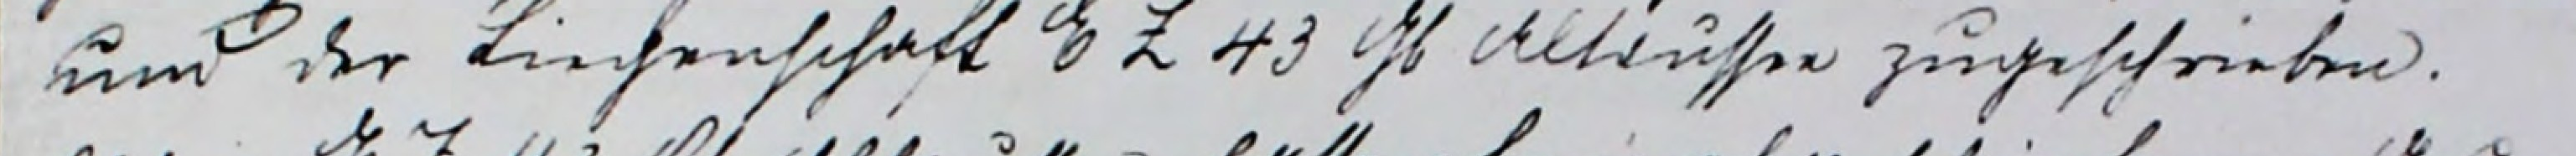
und der Liegenschaft E Z 43 Gb Altaussee zugeschrieben.
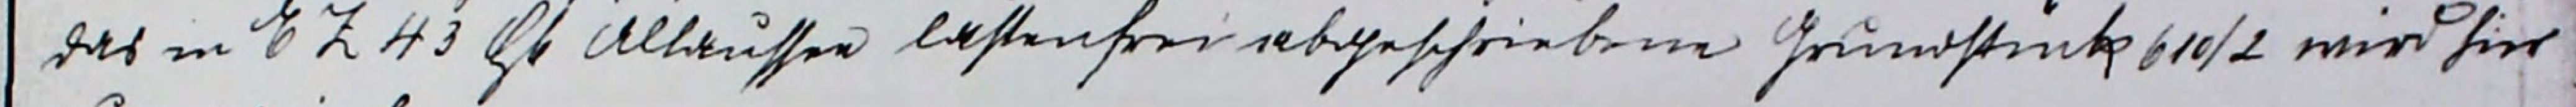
das in E Z 43 Gb Altaussee lastenfrei abgeschriebene Grundstück 610/2 wird hier
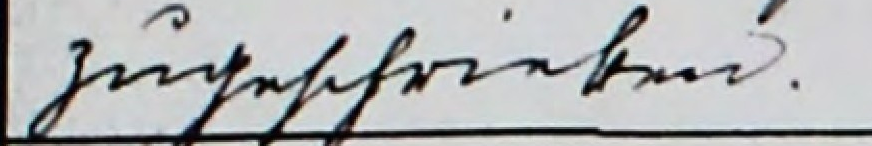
zugeschrieben.
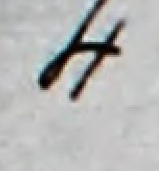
4
